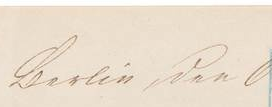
Berlin, den
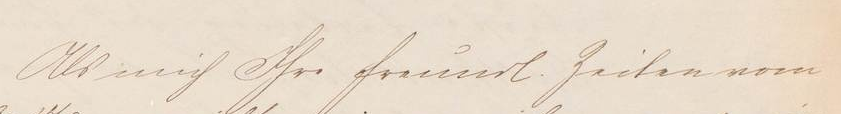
Als mich Ihre freundl. Zeilen vom
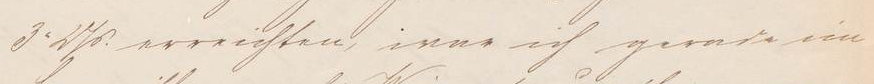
3t dss. erreichten, war ich gerade im
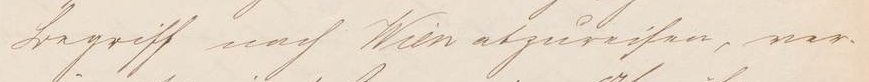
Begriff nach Wien abzureisen, ver-
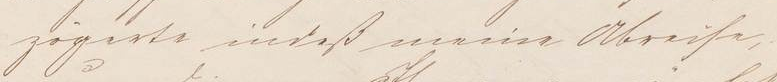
zögerte indeß meine Abreise,
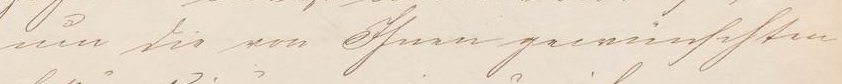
um die von Ihnen gewünschten
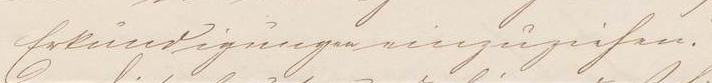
Erkundigungen einzuziehen.
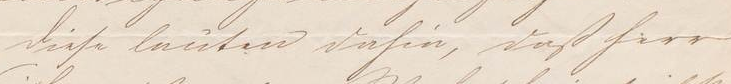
Diese lauten, dahin, daß Herr
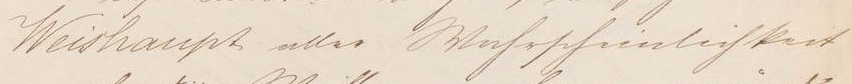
Weishaupt aller Wahrscheinlichkeit
